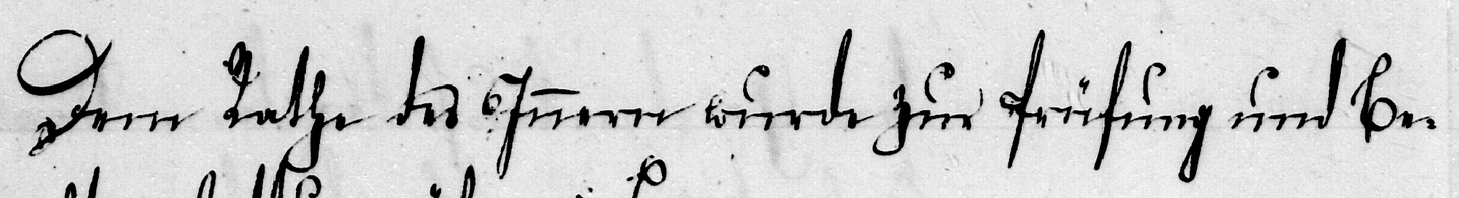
Dem Rathe des Innern wurde zur Prüfung und Be¬
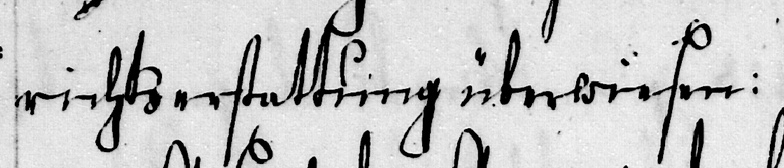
richtserstattung überwiesen:
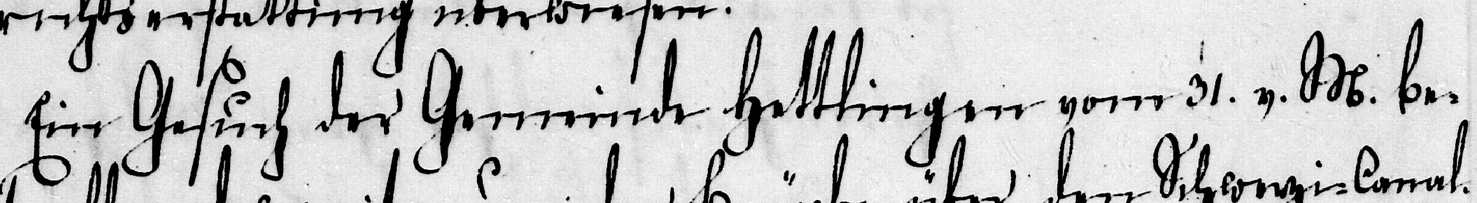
Ein Gesuch der Gemeinde Hettlingen vom 31. v. M. be¬
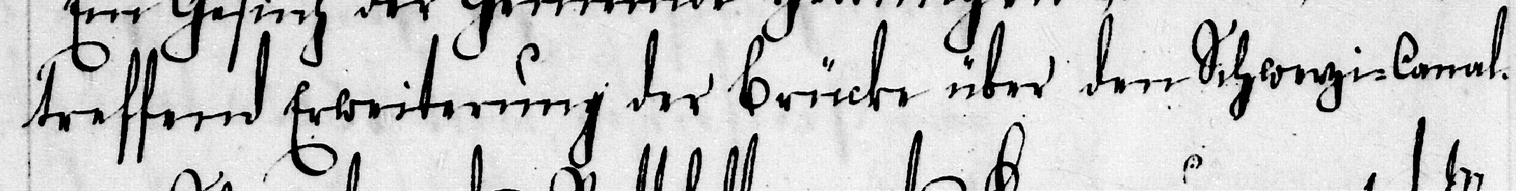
treffend Erweiterung der Brücke über dem Schwerzi-Canal.
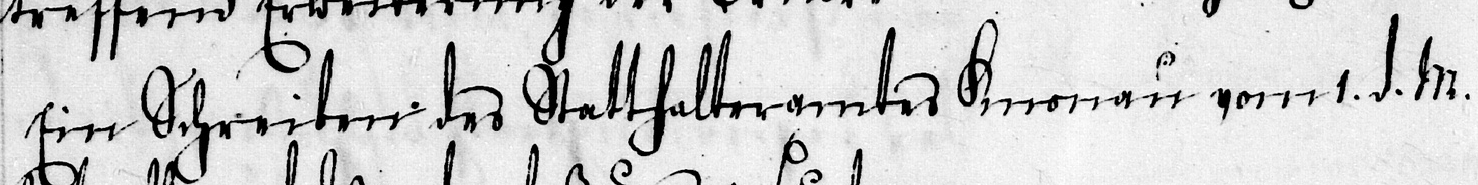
Ein Schreiben des Statthalteramtes Knonau vom 1. d. M.
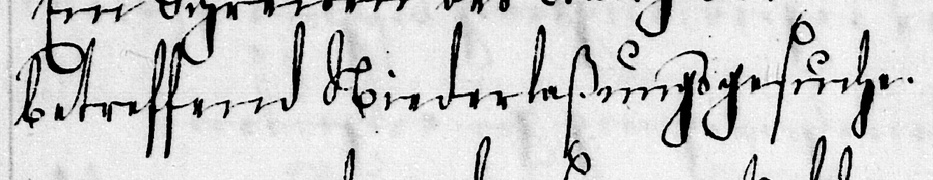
betreffend Niederlaßungsgesuche.
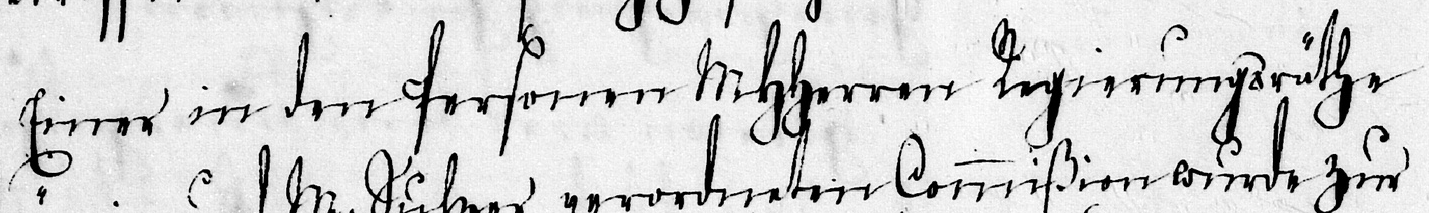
Einer in den Personen MHHerren Regierungsräthe
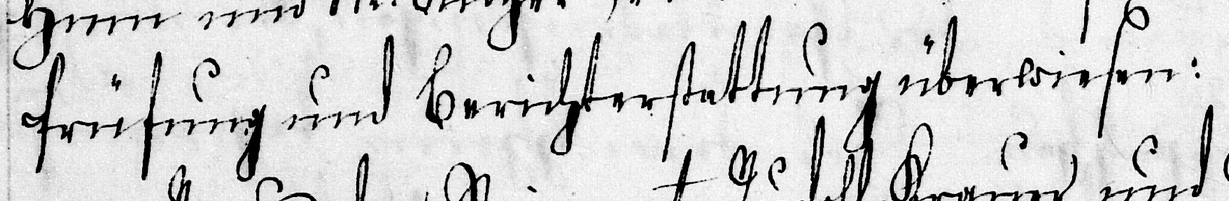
Prüfung und Berichterstattung überwiesen:
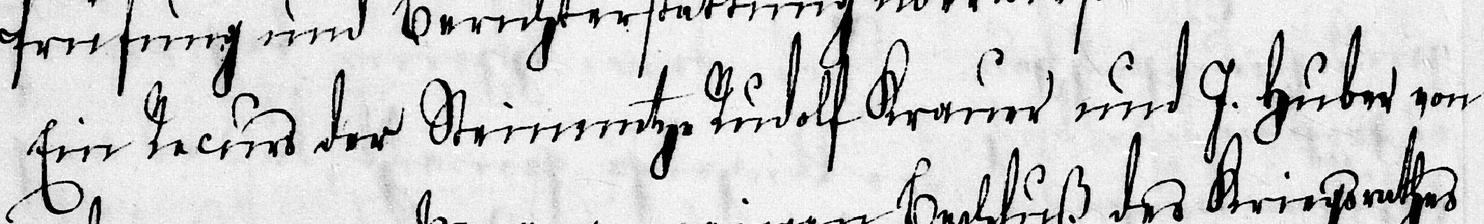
Ein Recurs der Steinmetze Rudolf Krauer und J. Huber von
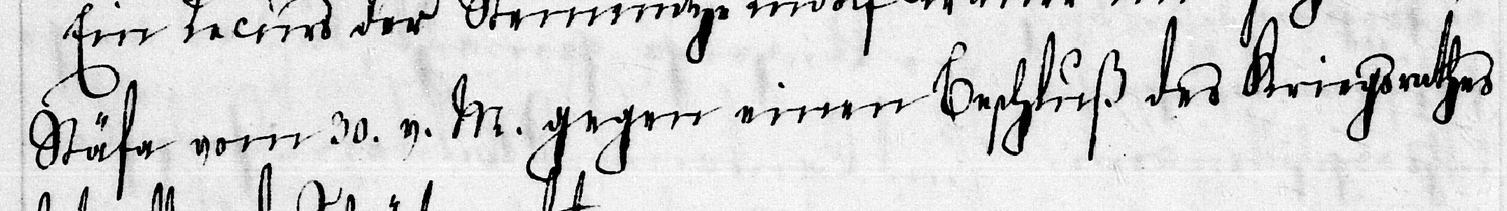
Stäfa vom 30. v. M. gegen einen Beschluß des Kriegsrathes
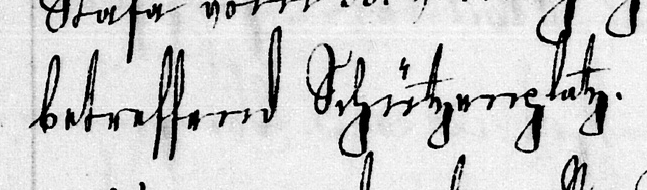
betreffend Schützenplatz.
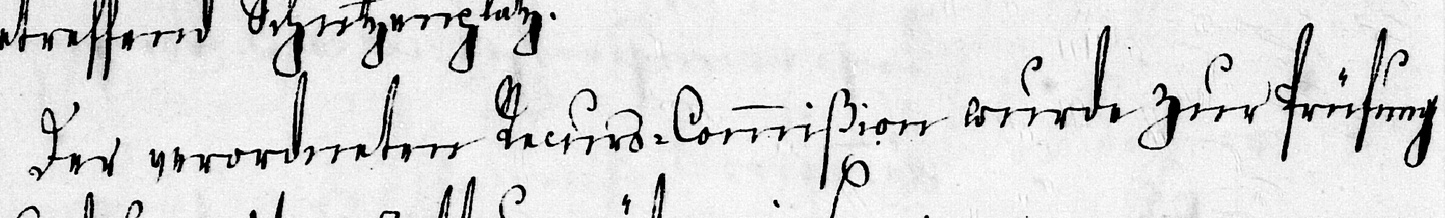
Der verordneten Recurs-Commißion wurde zur Prüfung
